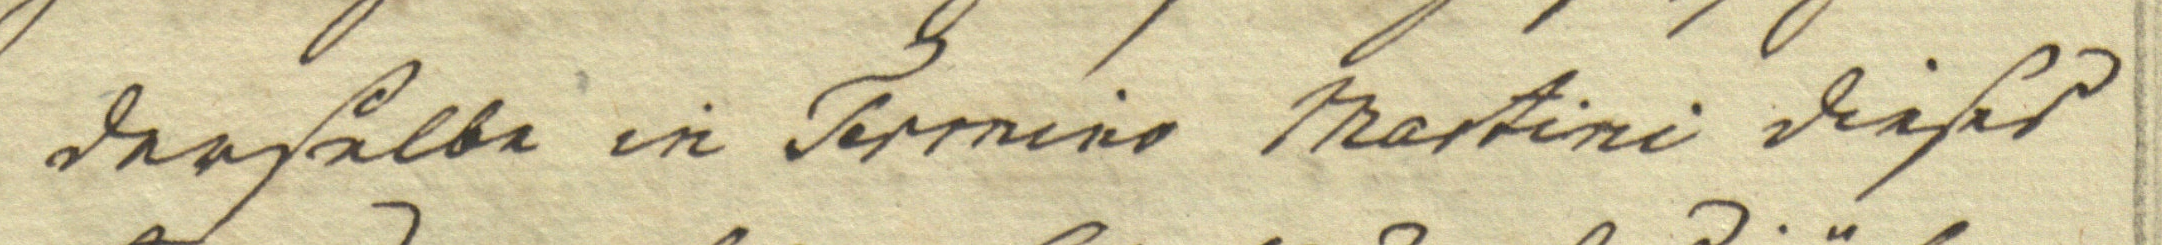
derselbe in Termino Martini dieses
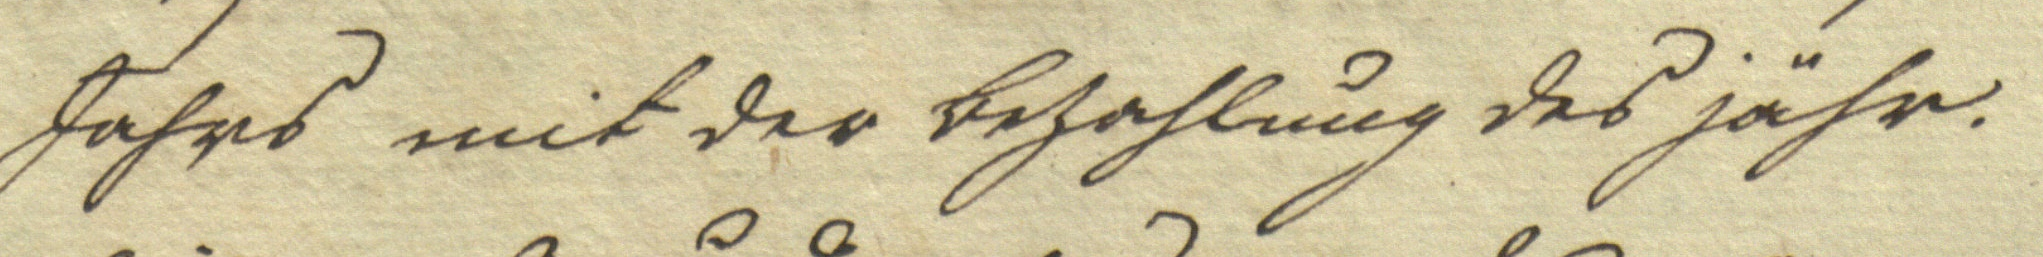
Jahres mit der Bezahlung des jähr¬
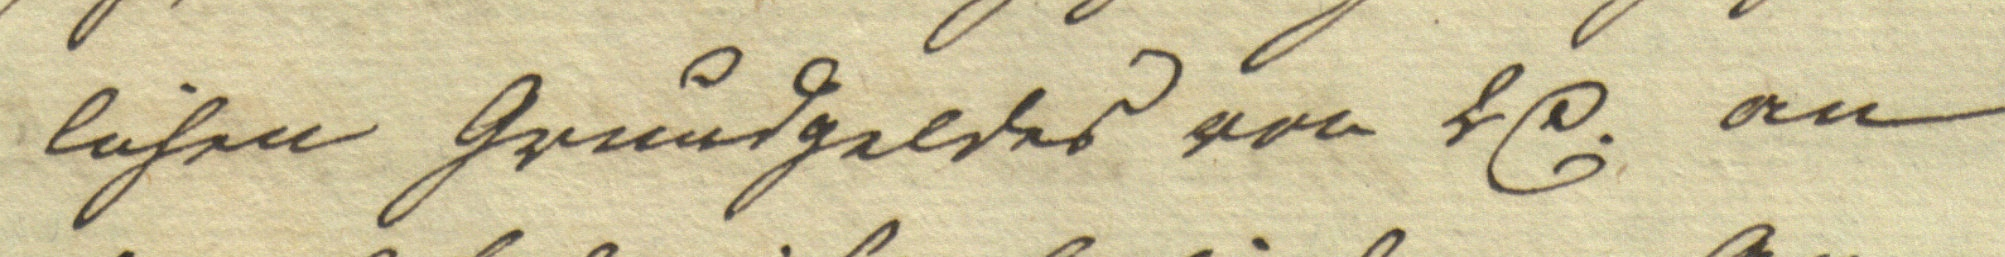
lichen Grundgeldes von 2 l. an
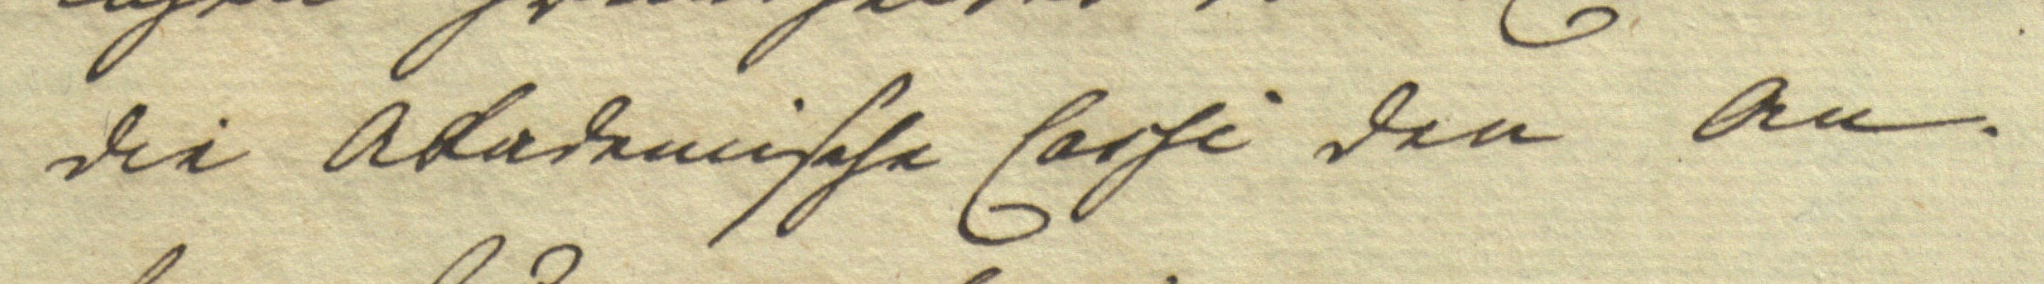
die Akademische Casse den An¬
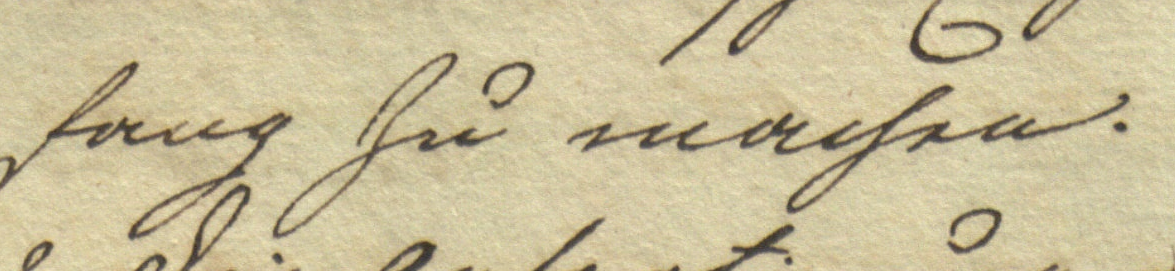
fang zu machen.
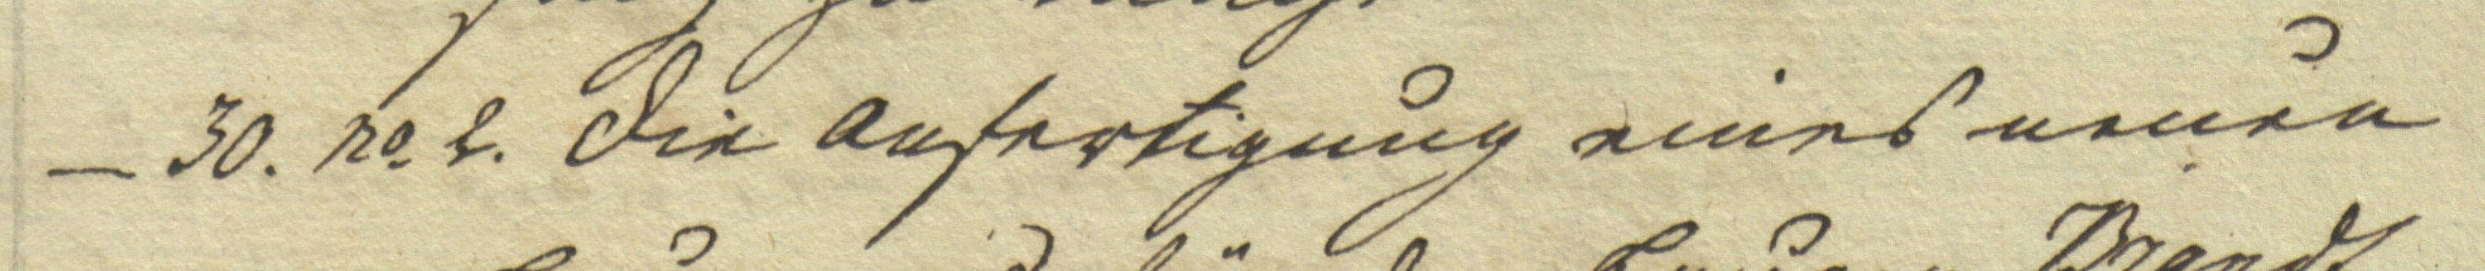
30. No 2. Die Anfertigung eines neuen
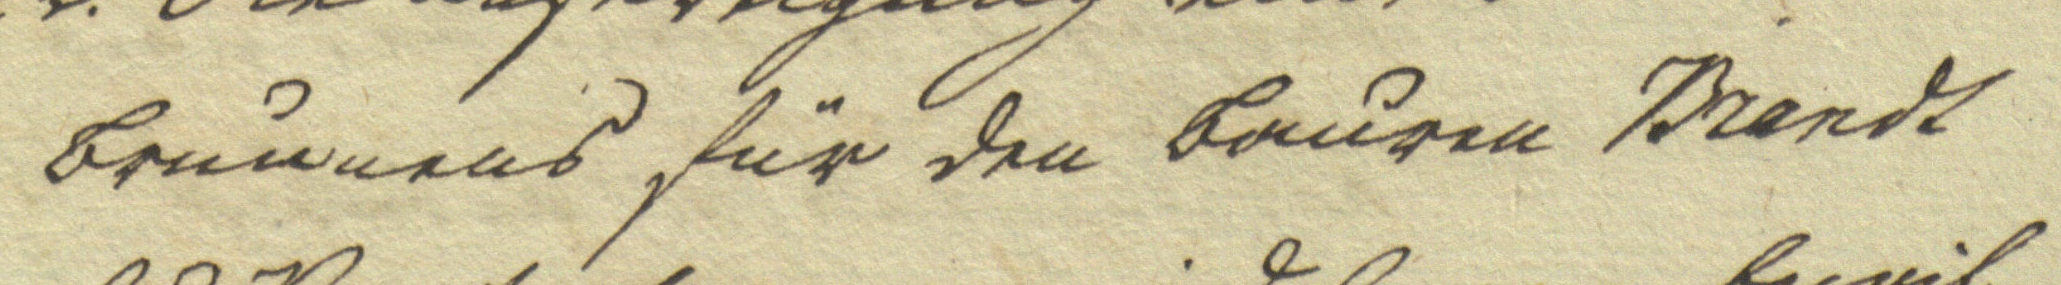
Brunnens für den Bauren Brandt
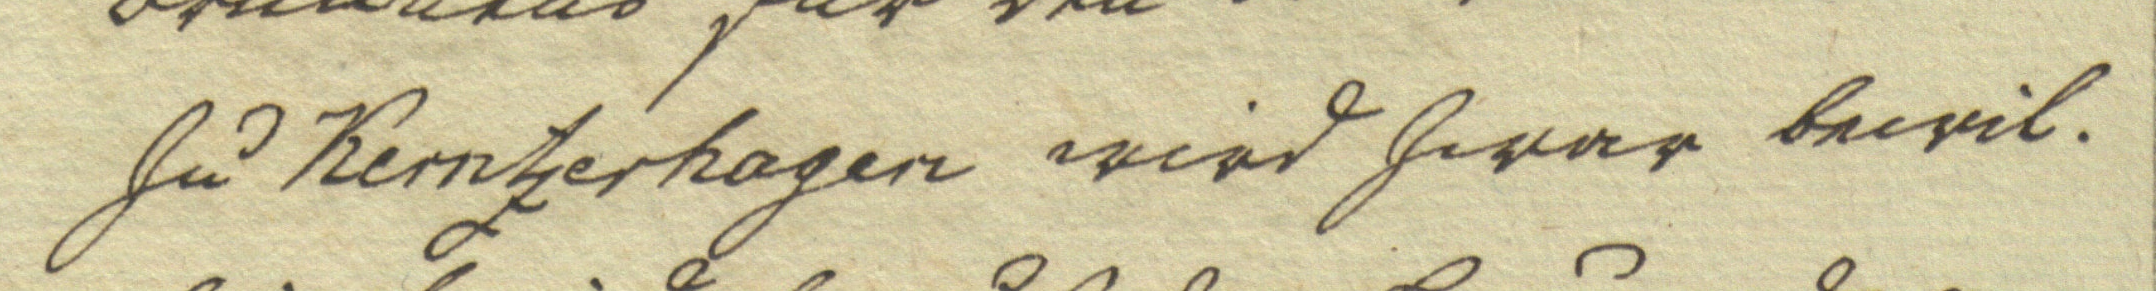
zu Kemtzerhagen wird zwar bewil¬
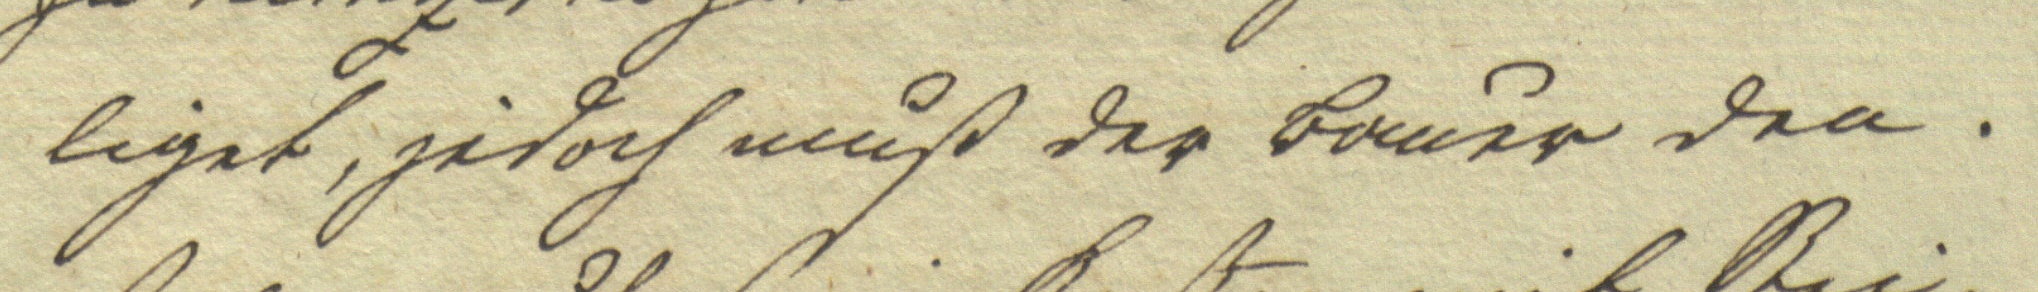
liget, jedoch muß der Bauer den¬
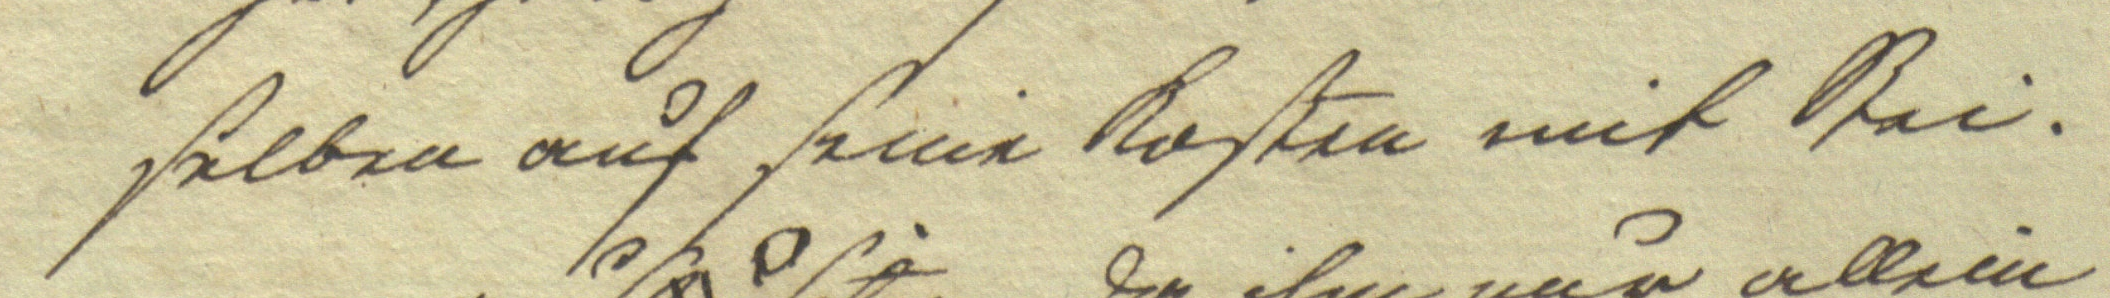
selben auf seine Kosten mit Stei¬
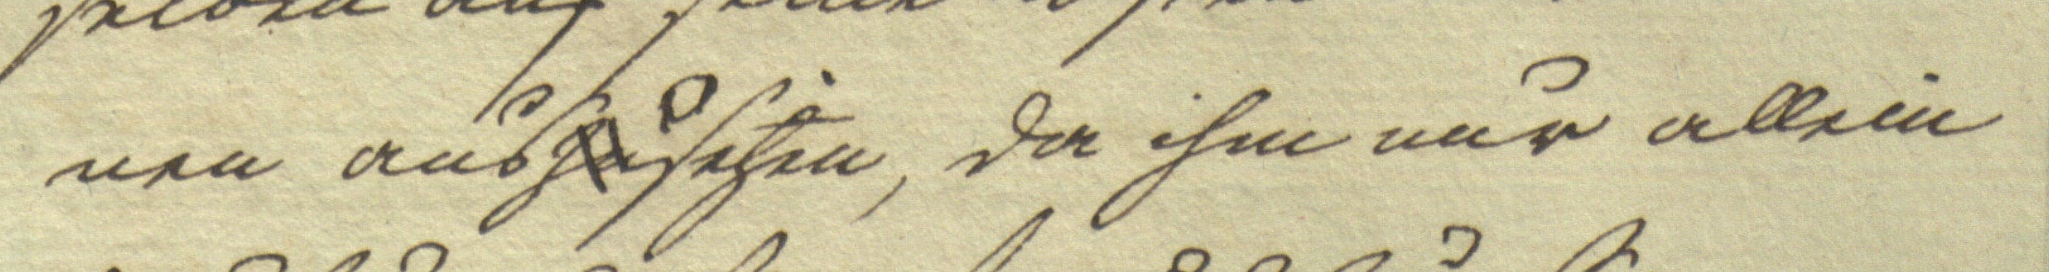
nen auszusetzen, da ihm nur allein
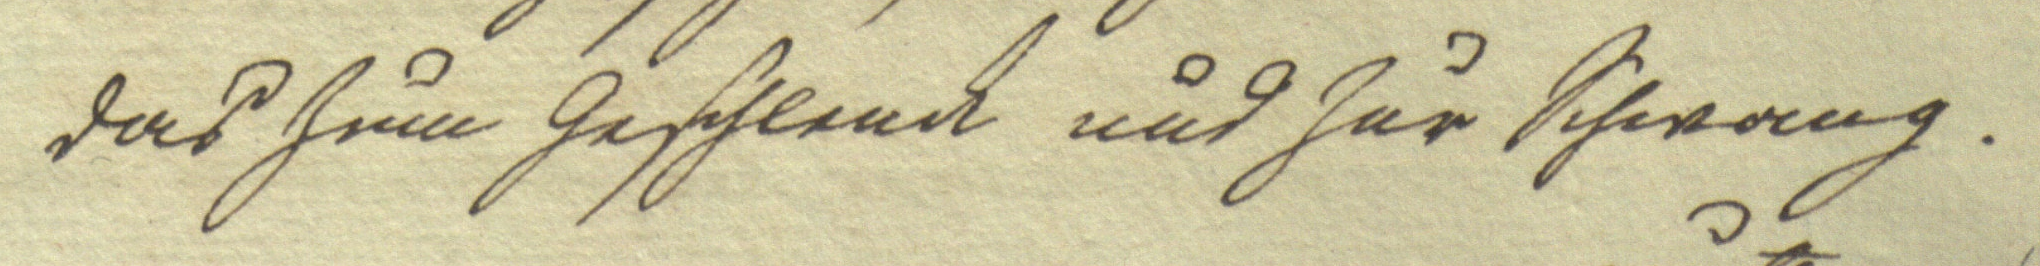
das zum Geschlenck und zur Schwang¬
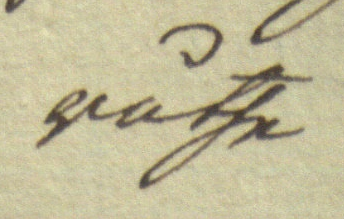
ruthe
